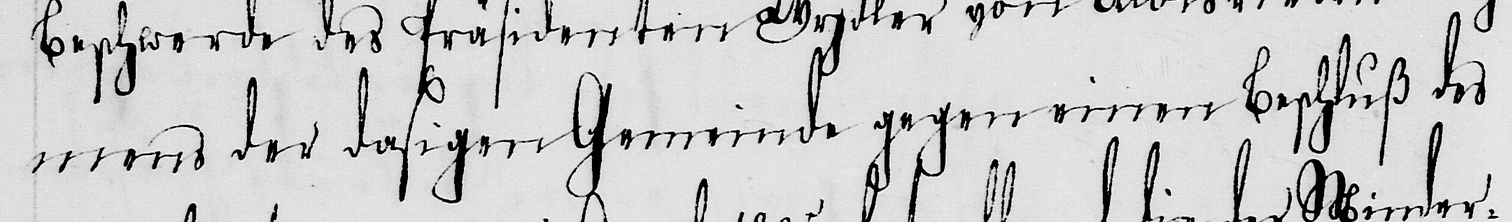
mens der dasigen Gemeinde gegen einen Beschluß des
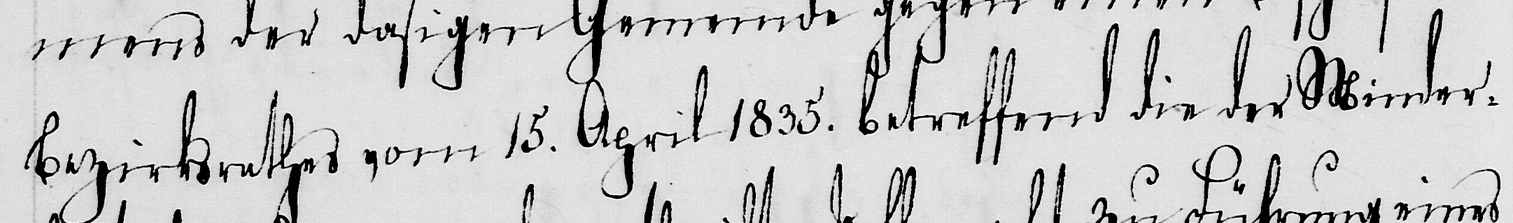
Bezirksrathes vom 15. April 1835. betreffend die der Minder¬
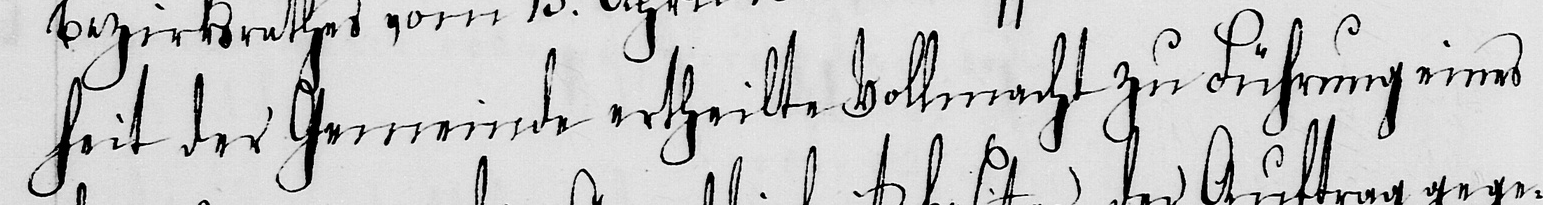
heit der Gemeinde ertheilte Vollmacht zu Führung eines
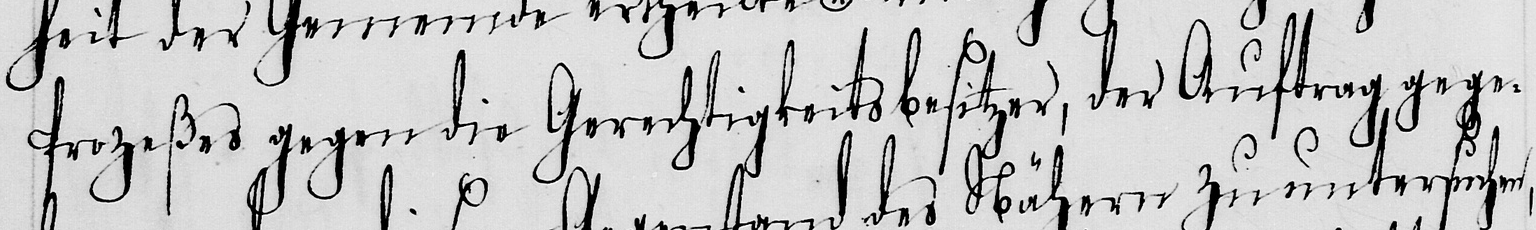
Prozeßes gegen die Gerechtigkeitsbesitzer, der Auftrag gege¬
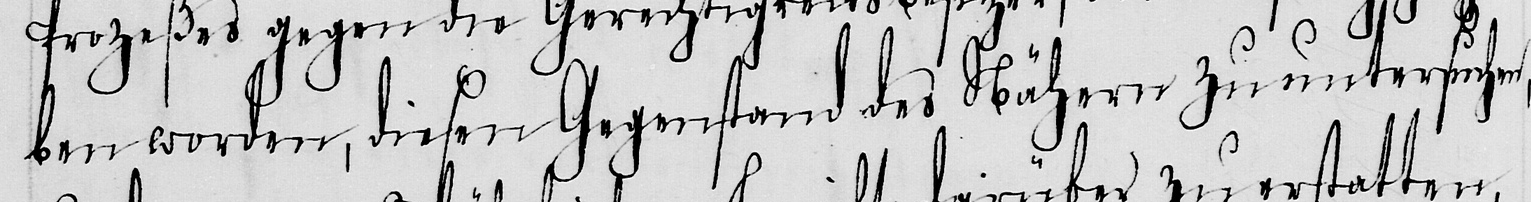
ben worden, diesen Gegenstand des Nähern zu untersuch¬
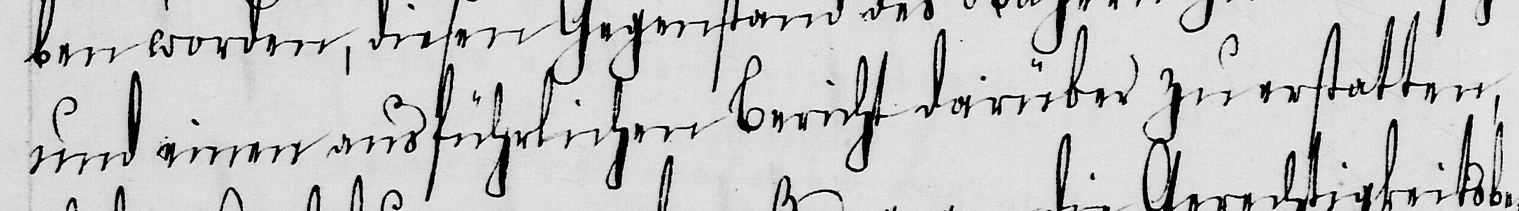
und einen ausführlichen Bericht darüber zu erstatten,
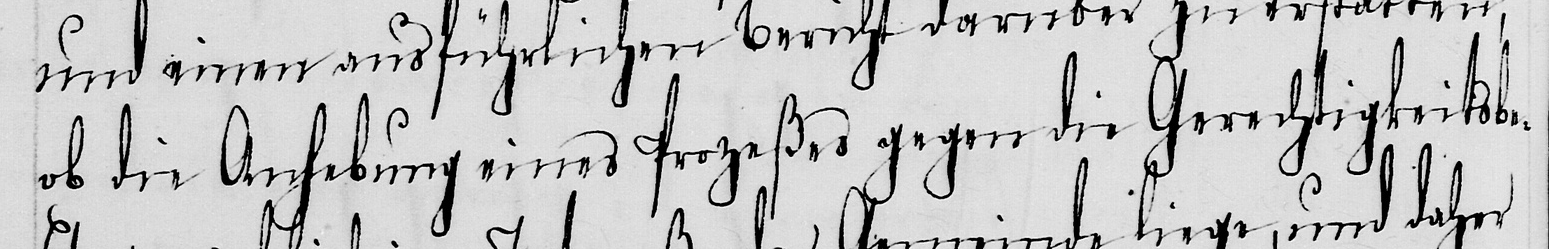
ob die Anhebung eines Prozeßes gegen die Gerechtigkeitsbe¬
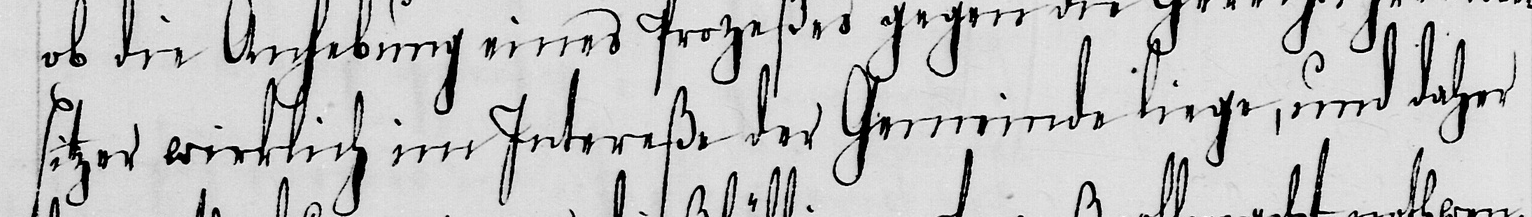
sitzer wirklich im Intereße der Gemeinde liege, und daher
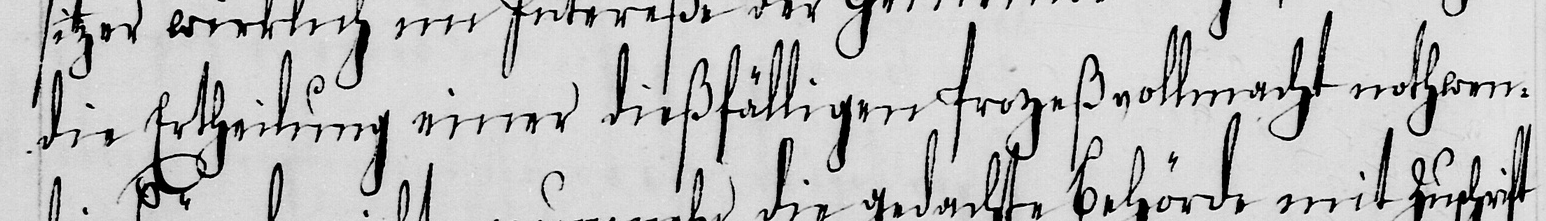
die Ertheilung einer dießfälligen Prozeßvollmacht nothwen¬
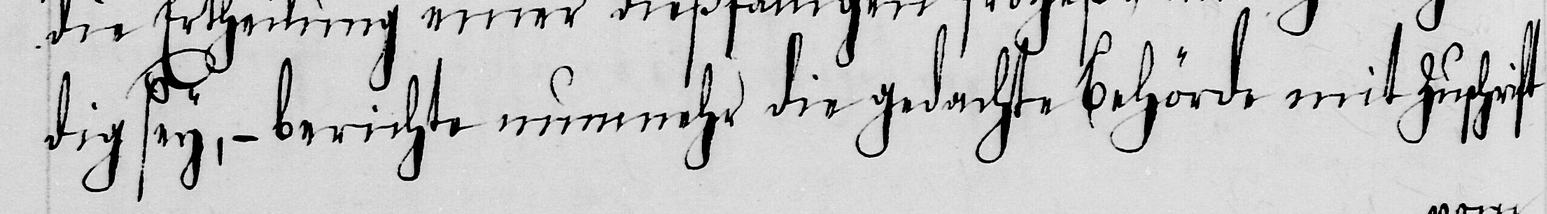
dig sey, – berichte nunmehr die gedachte Behörde mit Zuschr¬
